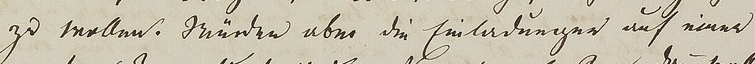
zu wollen. Würden aber die Einladungen auf einen
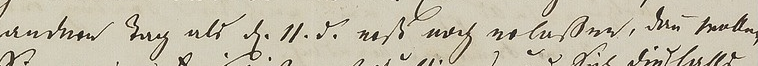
andern Tag als d. 11. d. erst noch erlassen, dann wollen
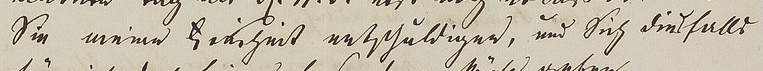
Sie meine Freiheit entschuldigen, und Sich diesfalls
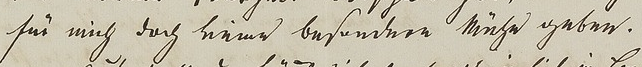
für mich doch keine besondere Mühe geben.
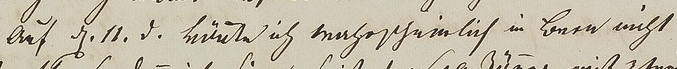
Auf d. 11. d. könnte ich wahrscheinlich in Bern nicht
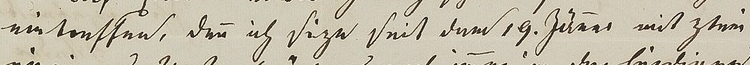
eintreffen, denn ich size seit dem 19. Jänner mit zwei
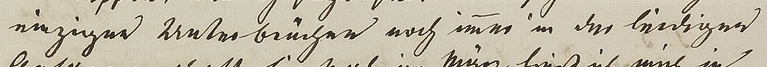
einzigen Unterbrüchen noch immer in der leidigen
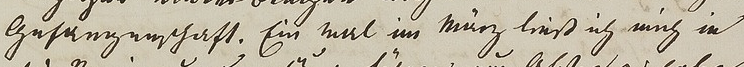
Gefangenschaft. Ein Mal im März ließ ich mich in
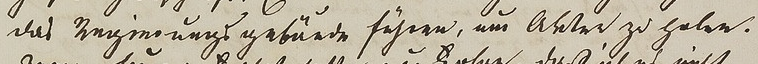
das Regierungsgebäude führen, um Akten zu holen.
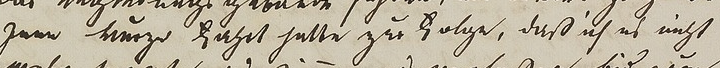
Jene kurze Fahrt hatte zur Folge, daß ich es nicht
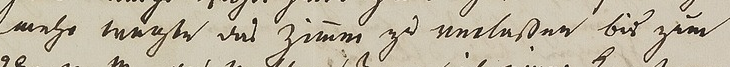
mehr wagte das Zimmer zu verlassen bis zum
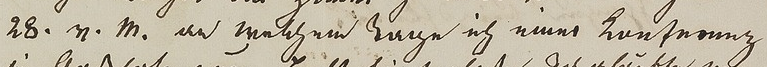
28. v. M. an welchem Tage ich einer Konferenz
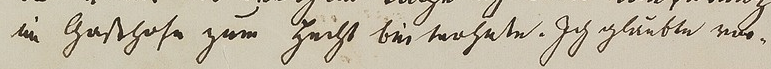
im Gasthofe zum Hecht beiwohnte. Ich glaubte vor-
